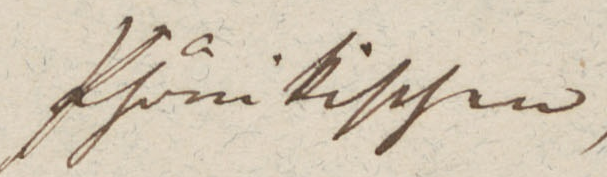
Phönikischen,
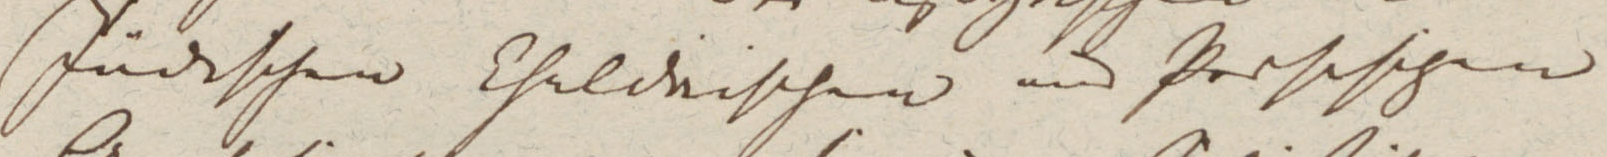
Jüdischen Chaldäischen und Persischen
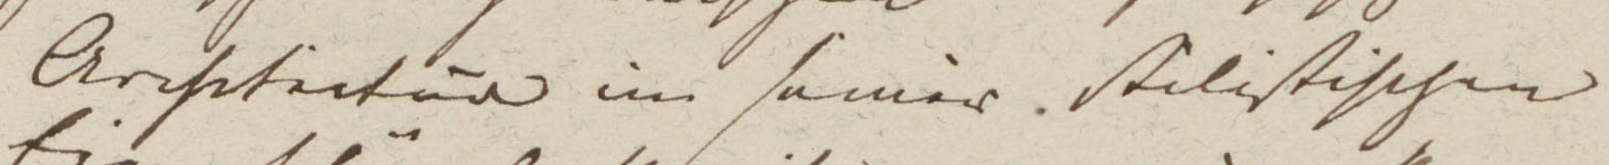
Architectur in seiner stilistischen
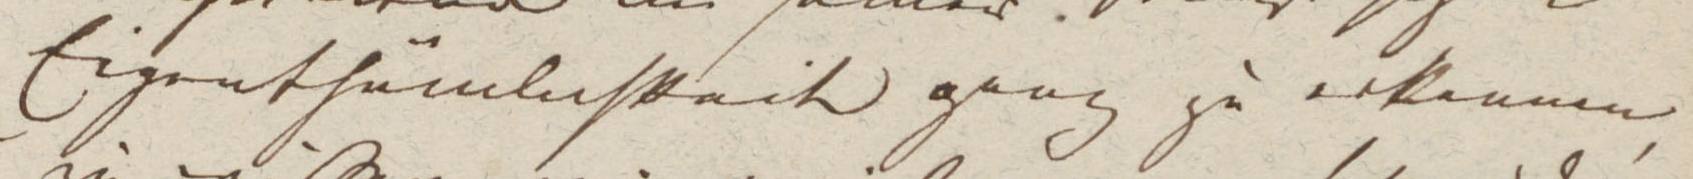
Eigenthümlichkeit ganz zu erkennen,
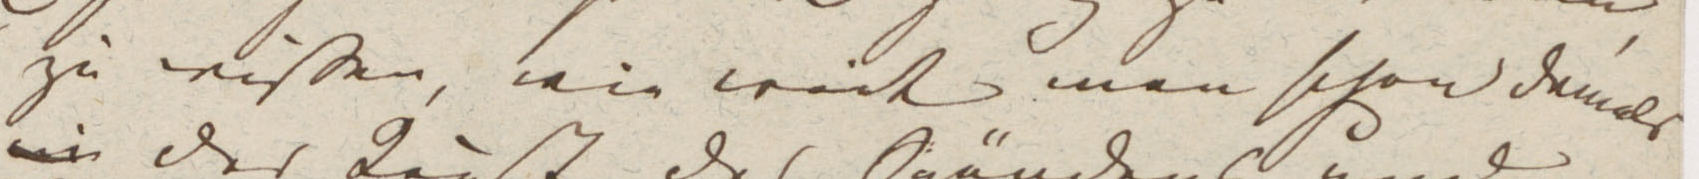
zu wissen, wie weit man schon damals
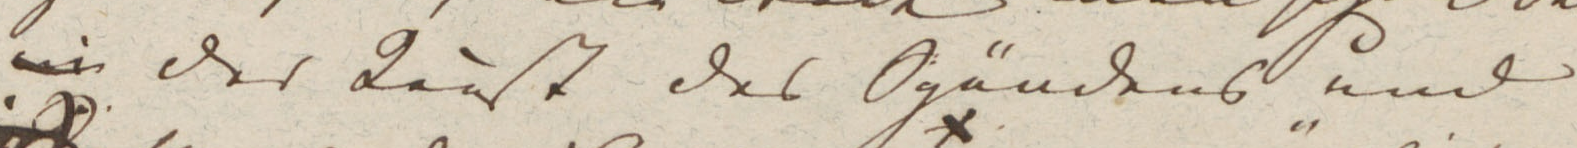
in der Kunst des Spündens und
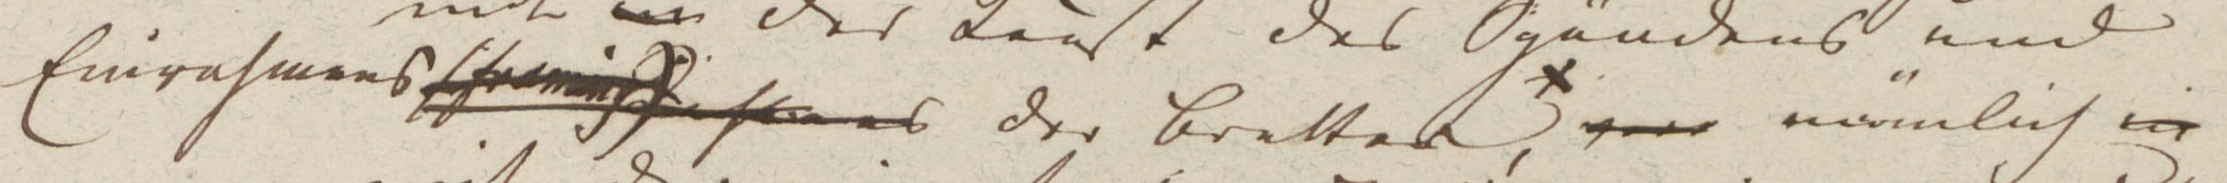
Einrahmens (framing) Kislens der Bretter, % vor nämlich in
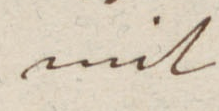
mit
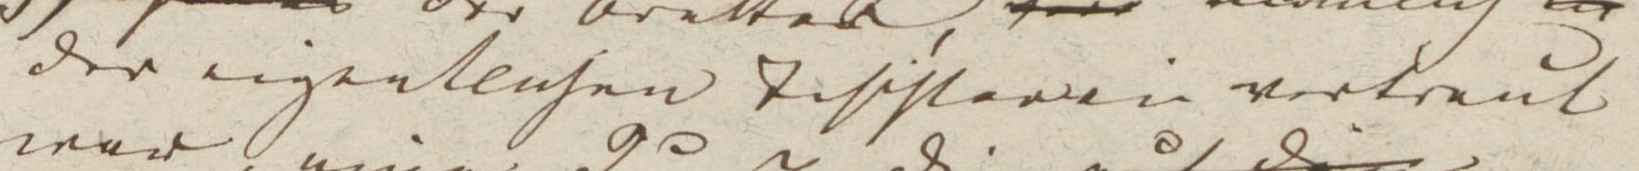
der eigentlichen Tischlerei vertraut
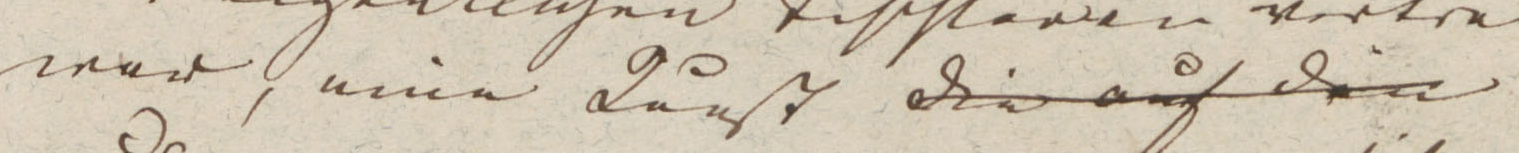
war, eine Kunst die auf den
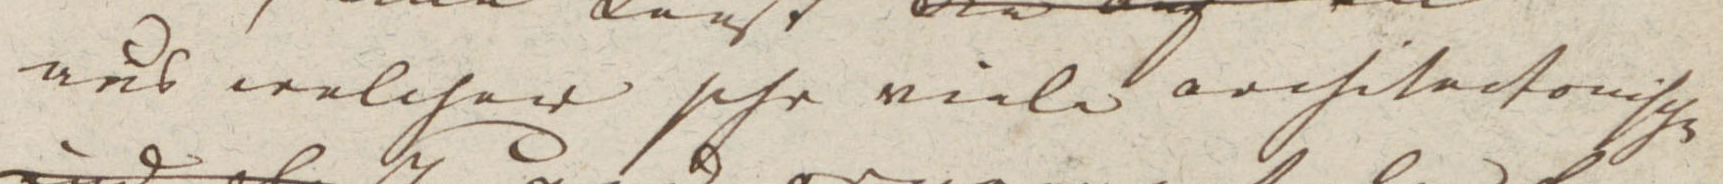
aus welcher sehr viele architectonische
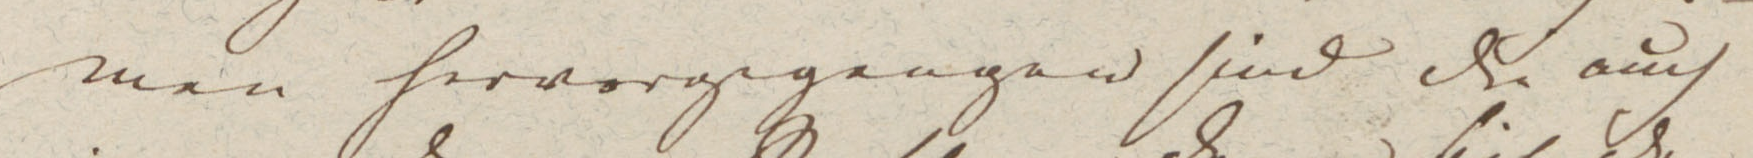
men hervorgegangen sind die auch
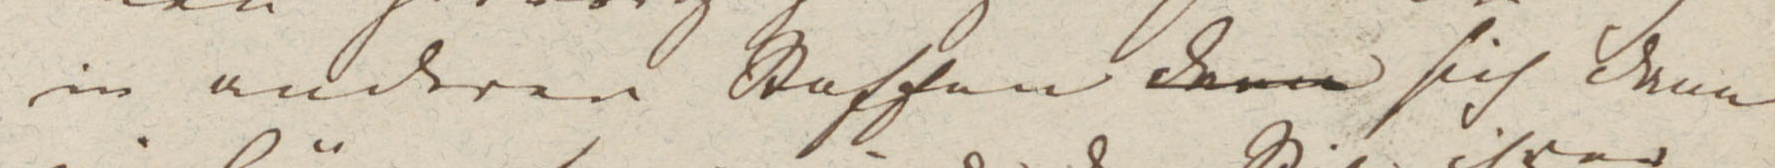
in anderen Stoffen dann sich dann
